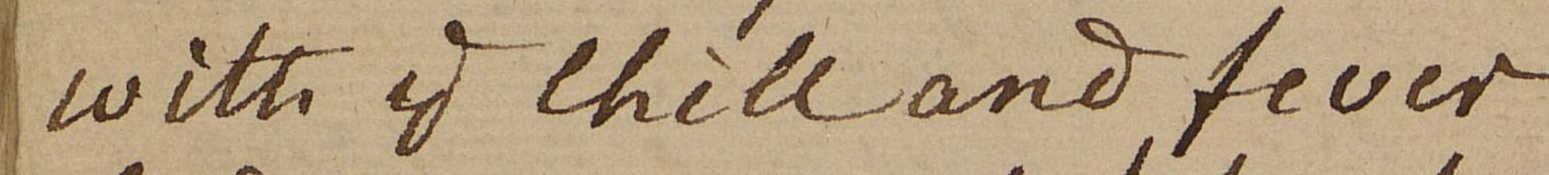with y^e chill and fever
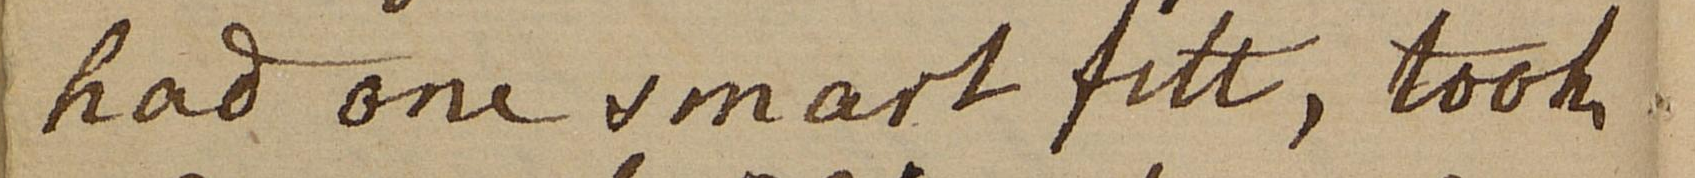had one smart fitt, took
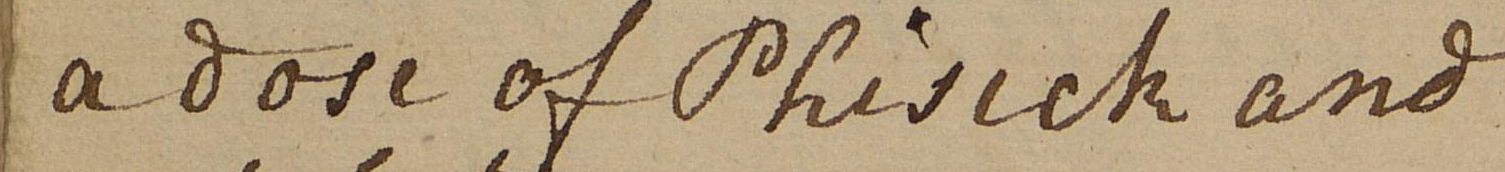a dose of Phisick and
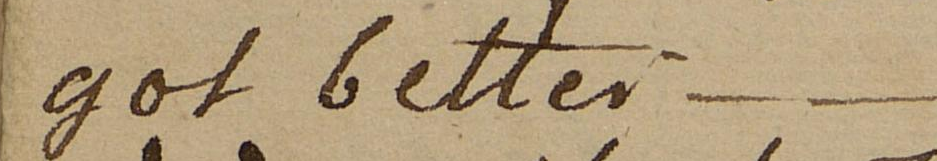got better-
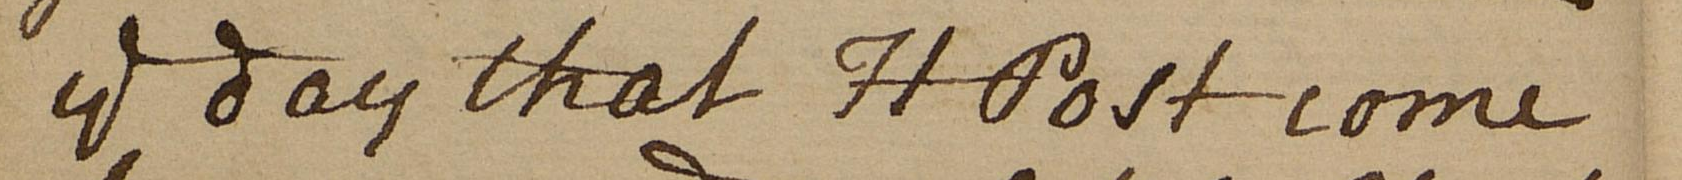y^e day that H Post come
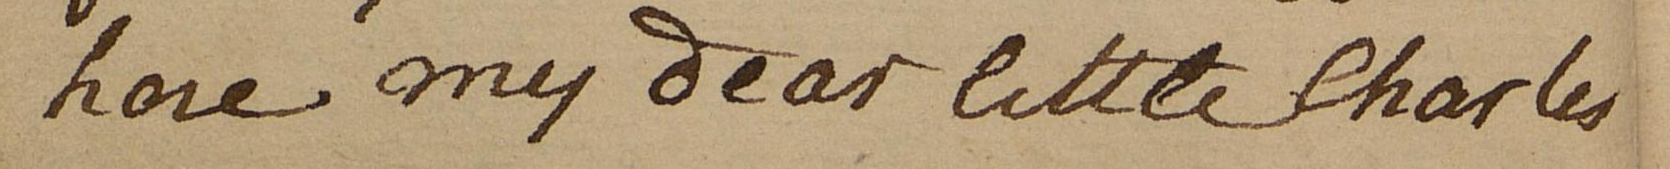here my dear little Charles
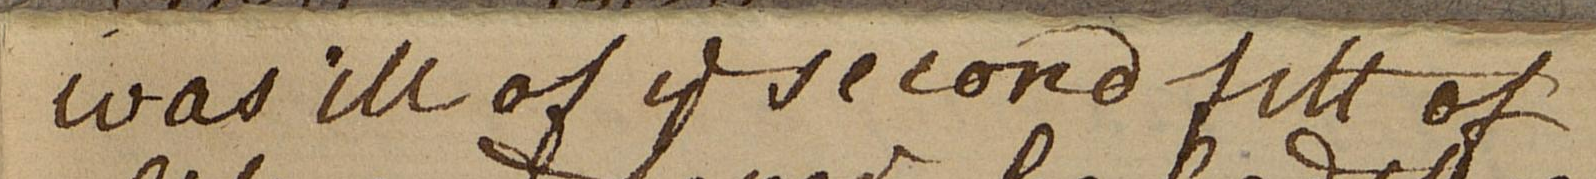was ill of y^e second fitt of
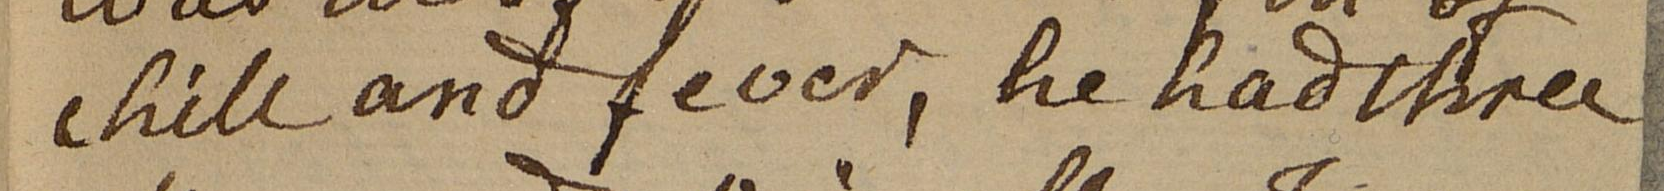chill and fever, he had three
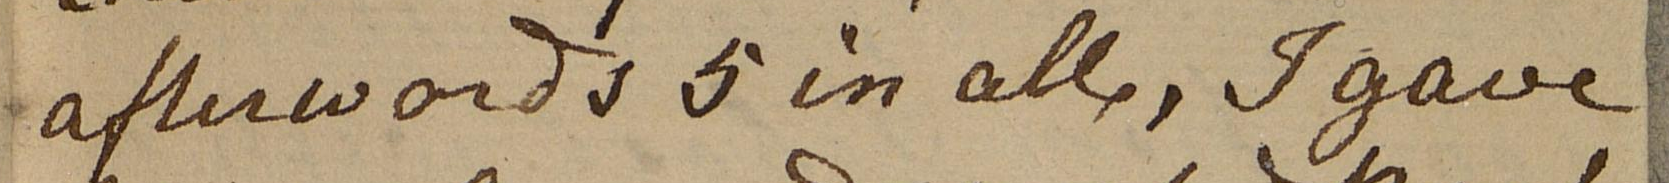afterwards 5 in all, I gave
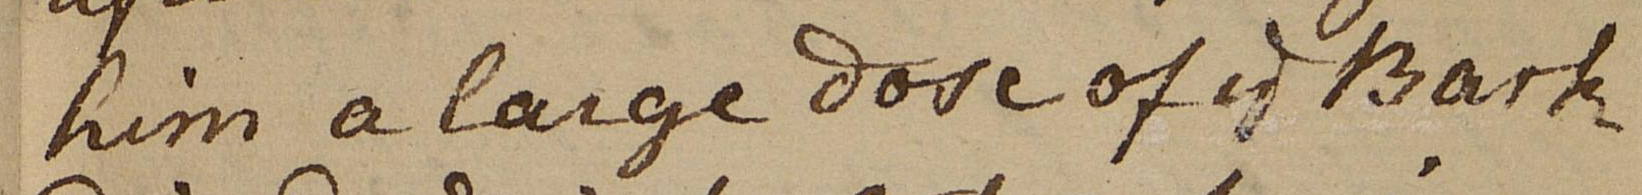him a large dose of y^e Bark
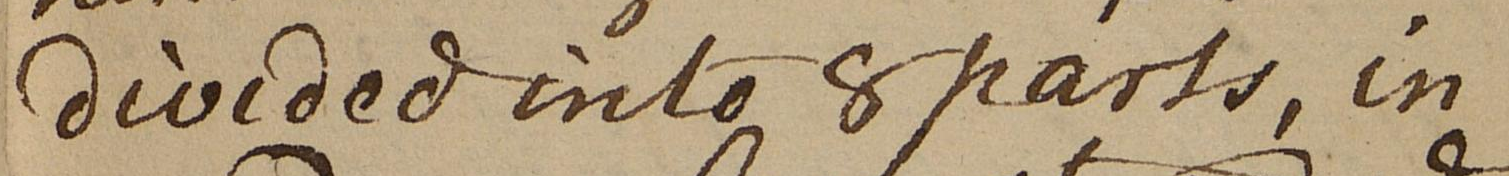divided into 8 parts, in
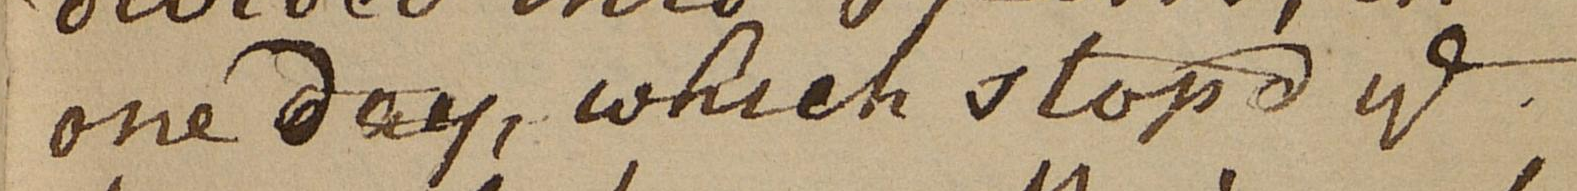one day, which stopd y^e
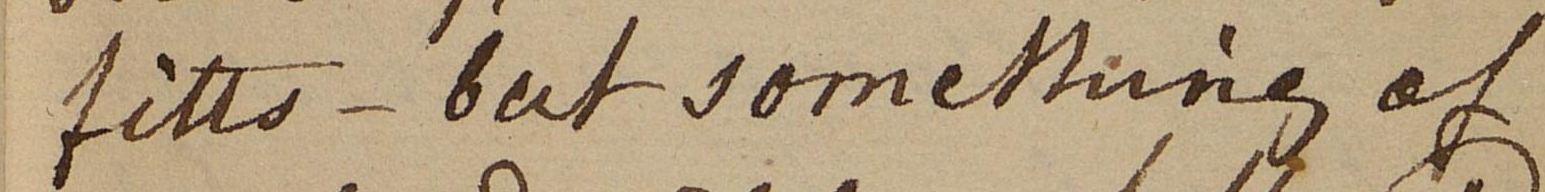fitts- but something of
